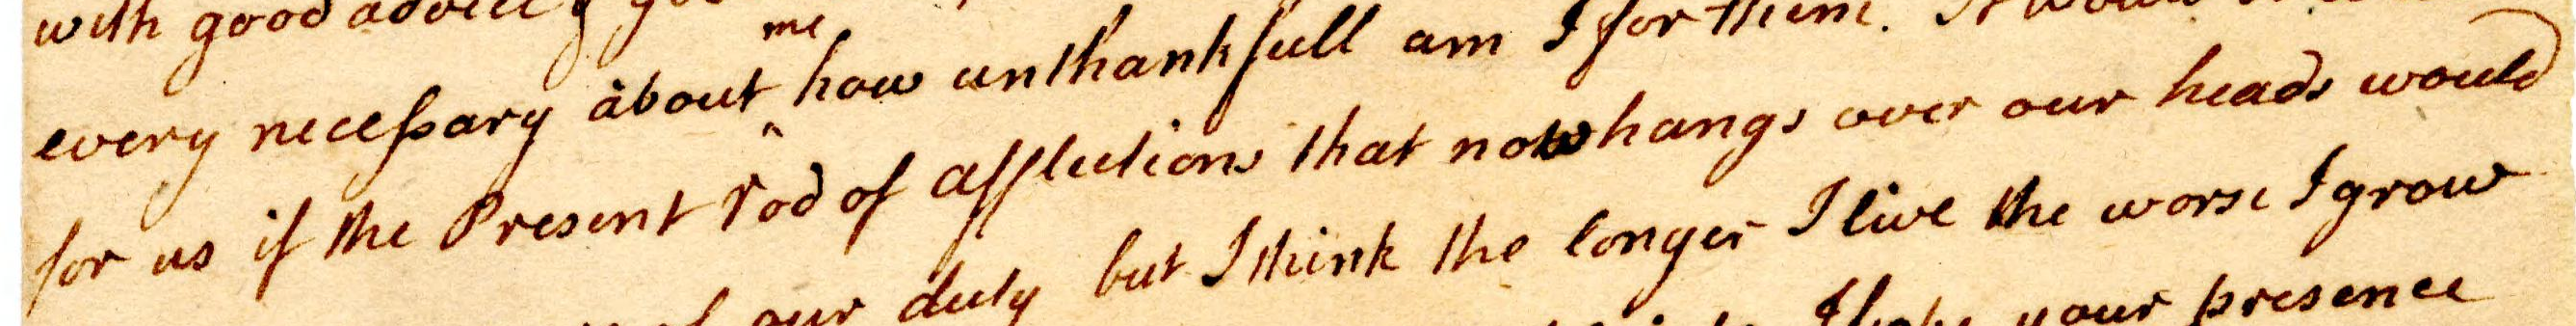for us if the Present rod of afflictions that now hangs over our heads would
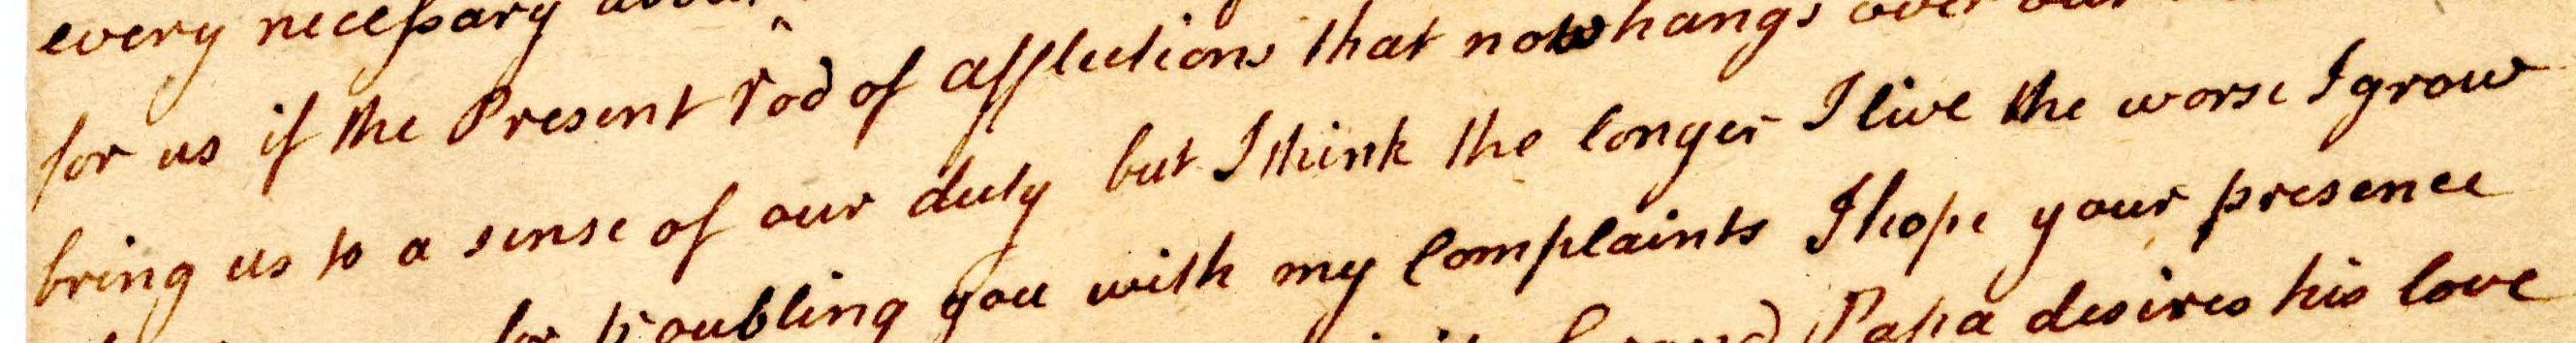bring us to a sense of our duty but I think the longer I live the worse I grow
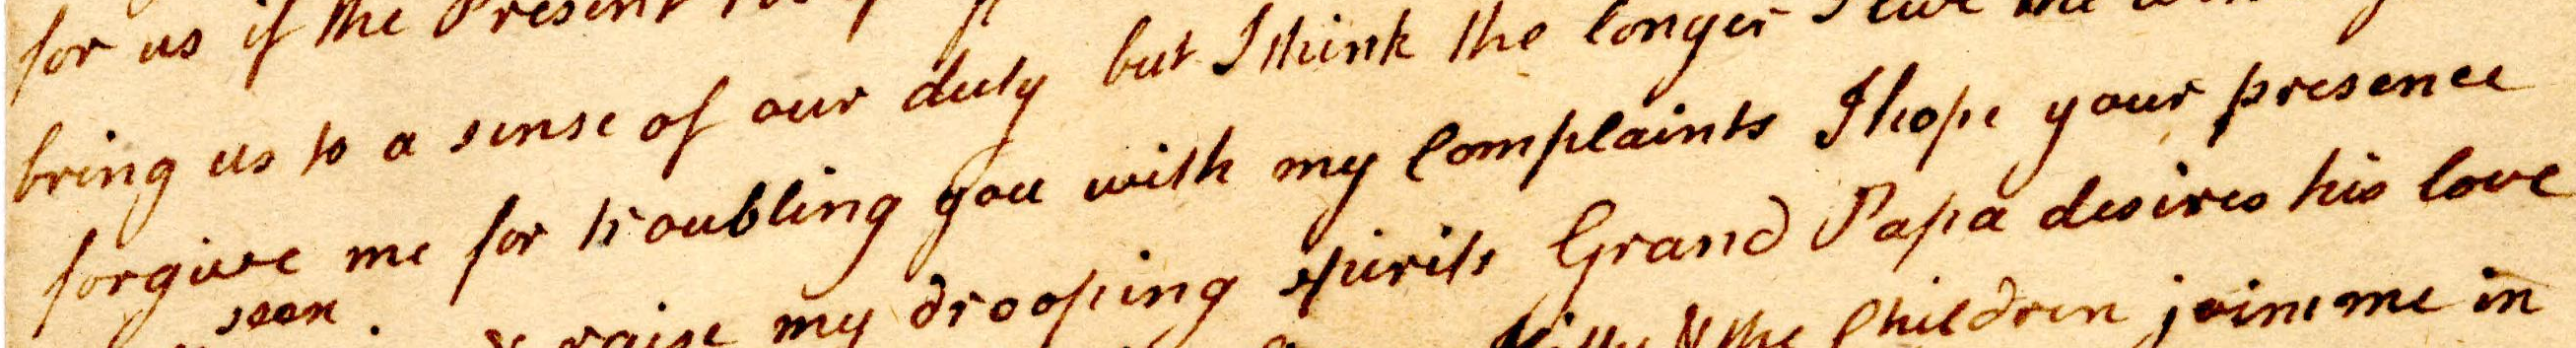forgive me for troubling you with my complaints I hope your presence
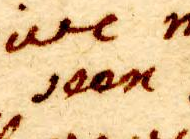soon
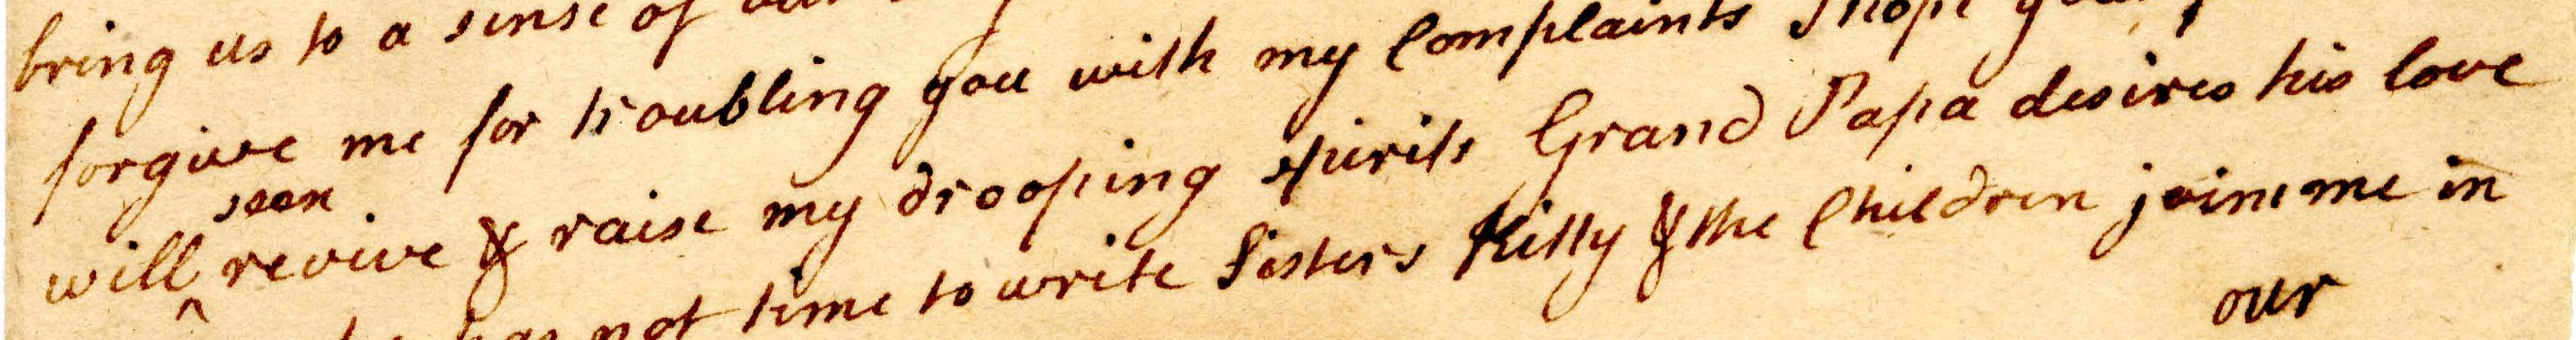will ^ revive & raise my drooping spirits Grand Papa desires his love
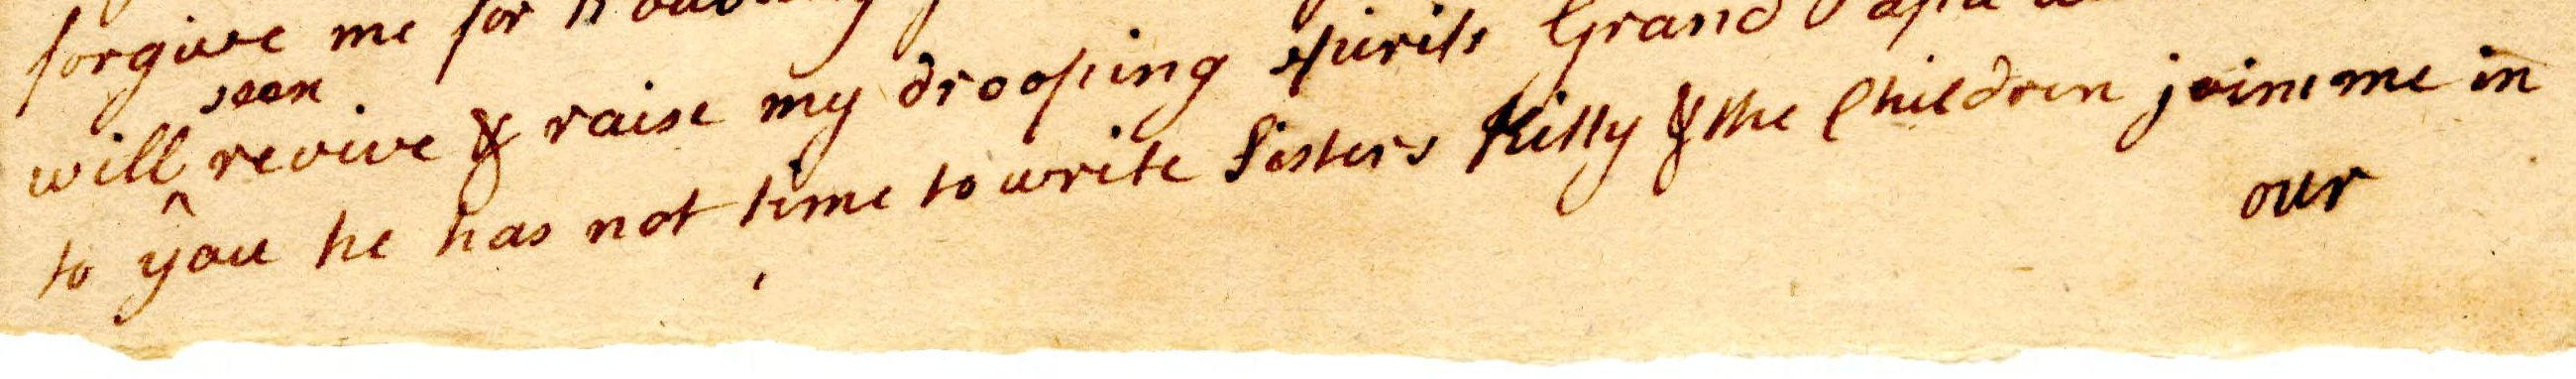to you he has not time to write Sister's Kitty & the Children joins me in
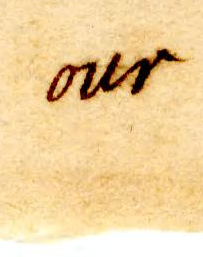our
